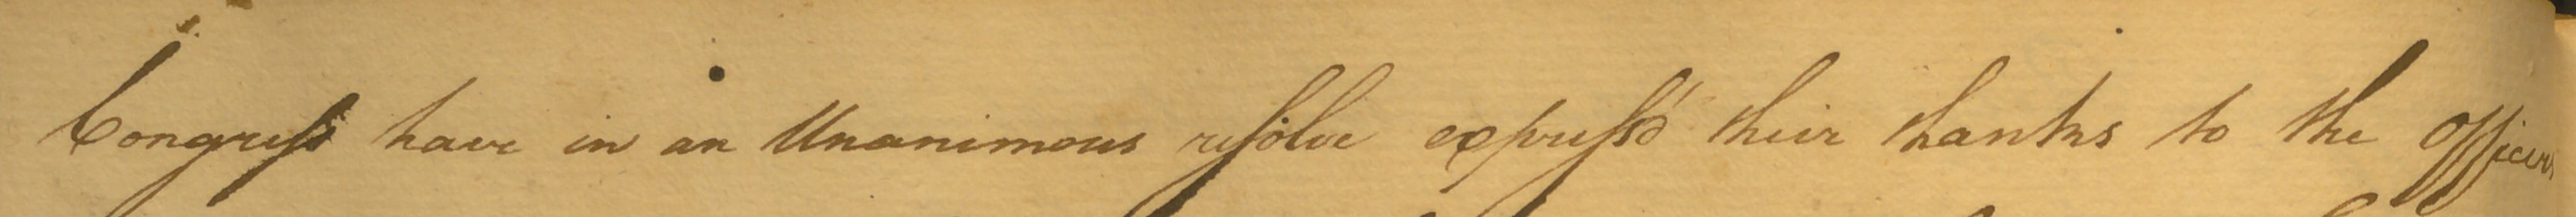Congress have in an Unanimous resolve express'd their thanks to the officers
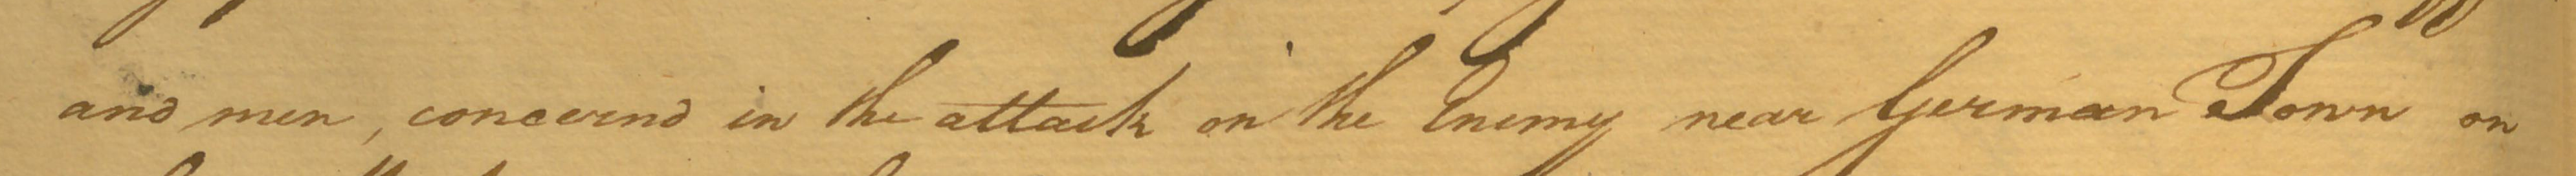and men, concernd in the attack on the Enemy near German Town on
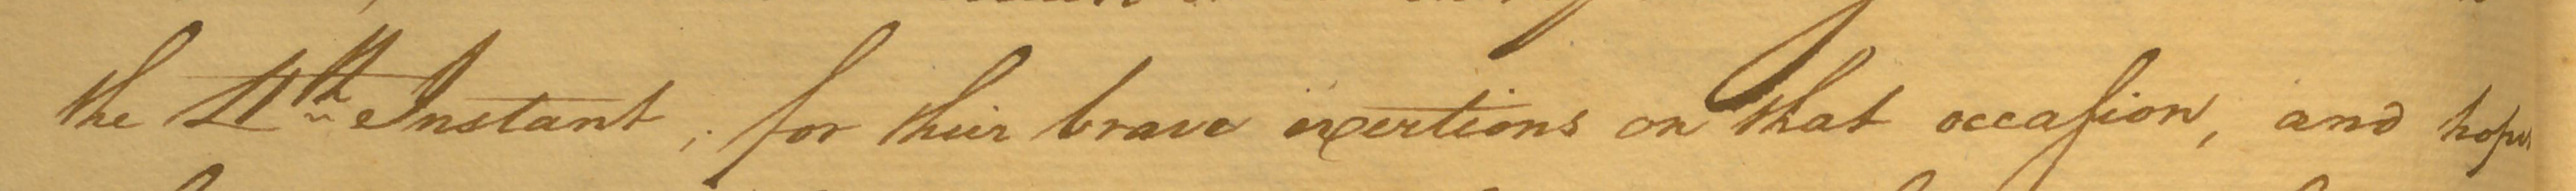the 11^th. Instant for their brave exertions on that occasion, and hope
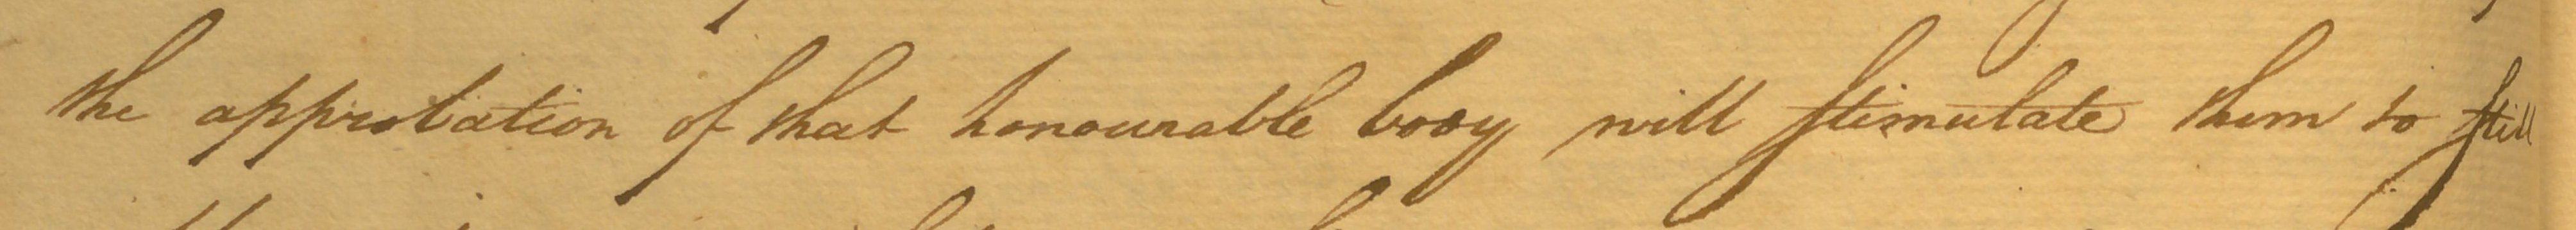the approbation of that honorable body will stimulate them to still
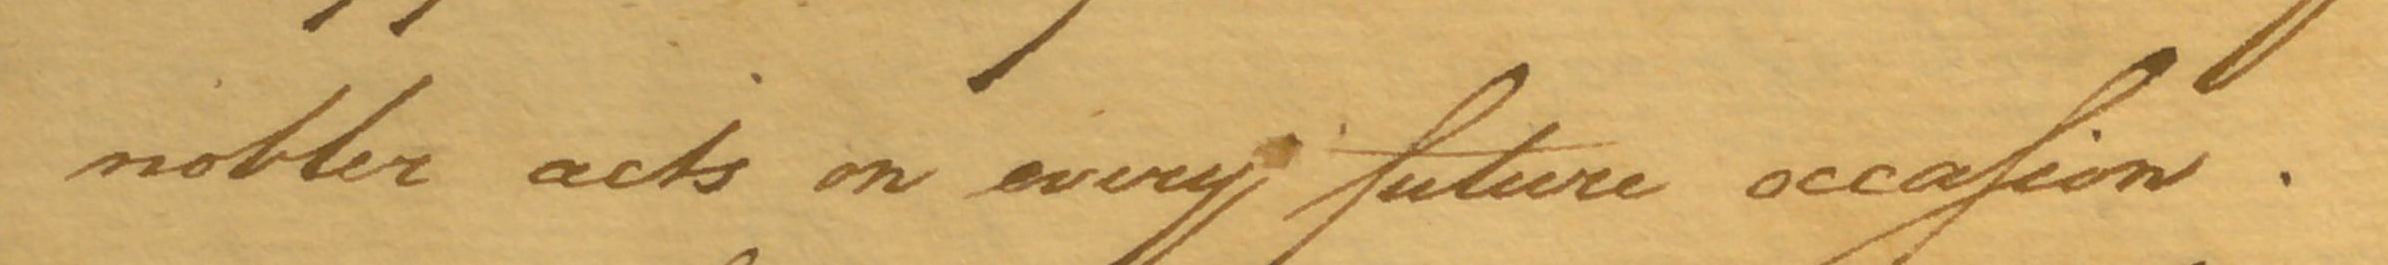nobler acts on every future occasion.
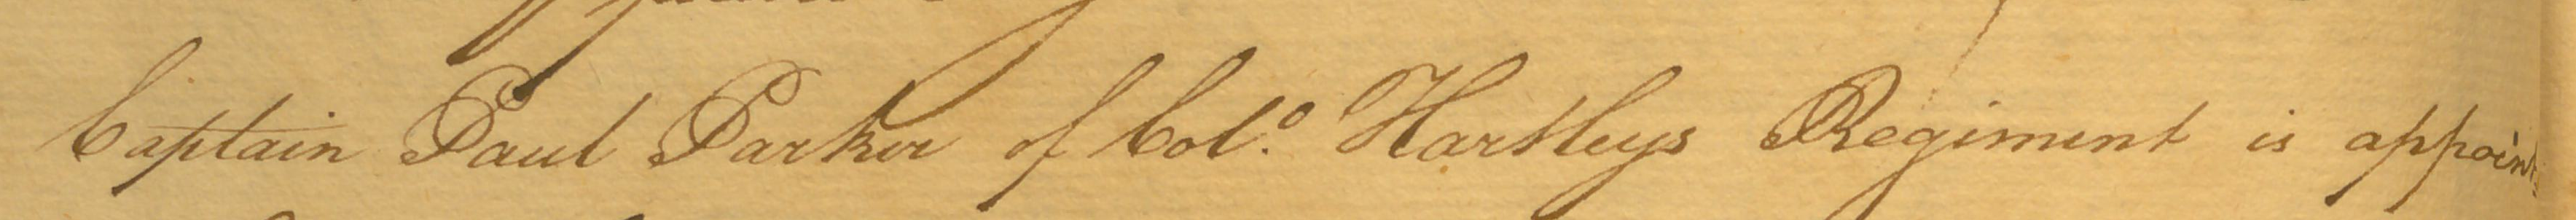Captain Paul Parker of Col^o. Hartleys Regiment is appoint
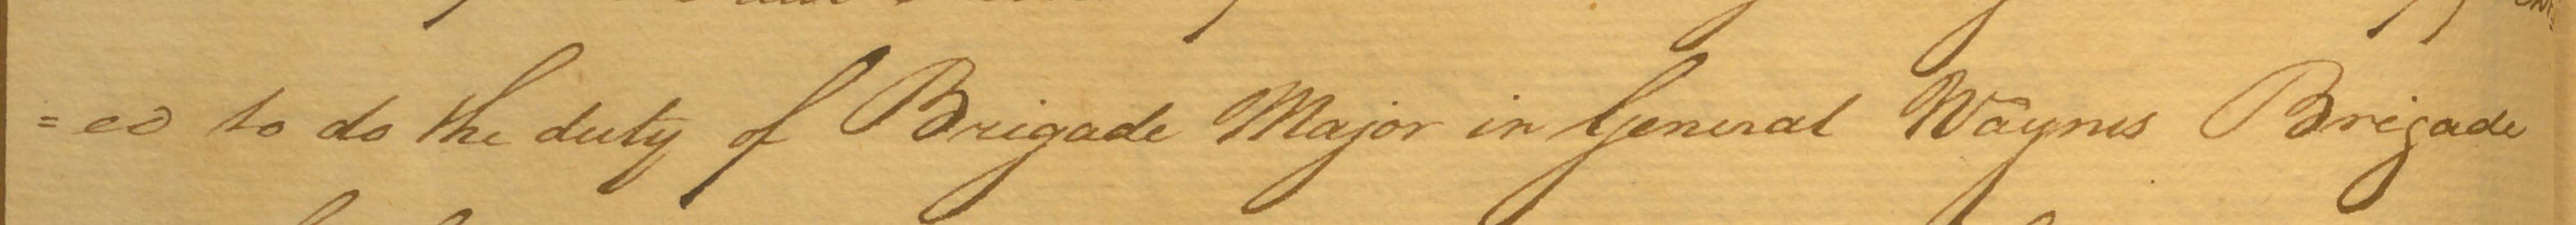-ed to do the duty of Brigade Major in General Waynes Brigade
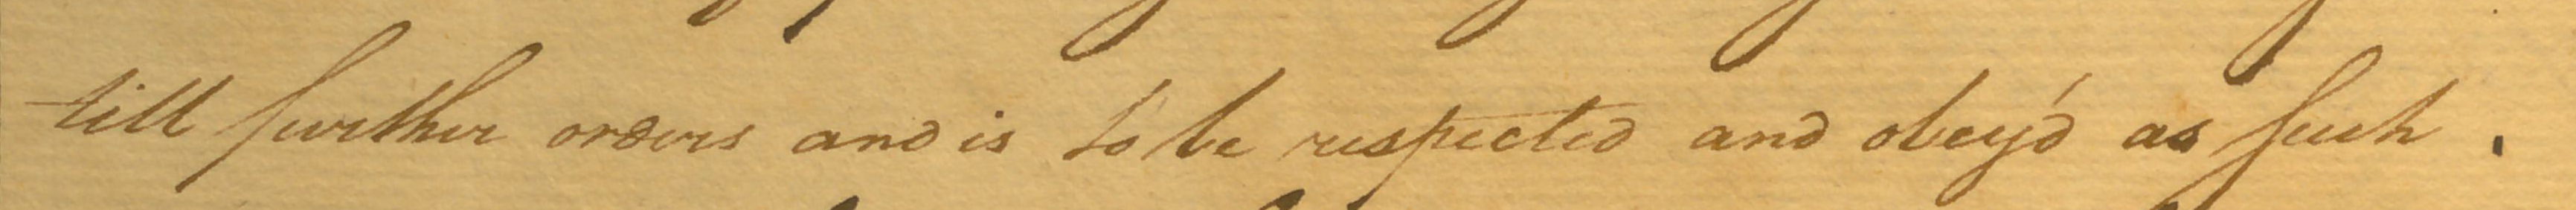till further orders and is to be respected and obey'd as such.
